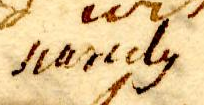scarcely
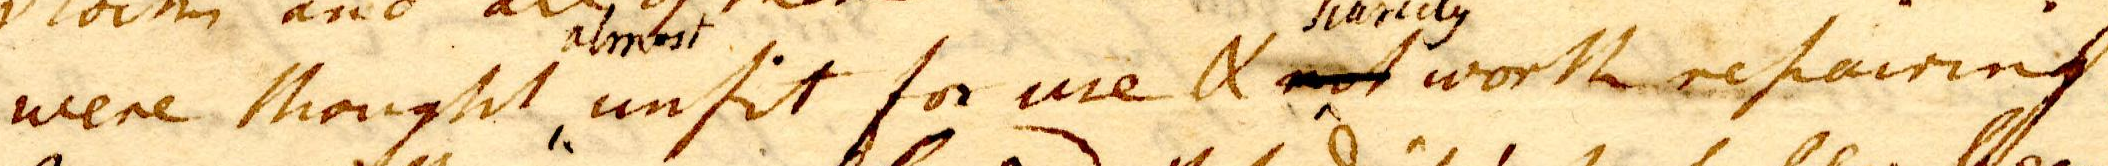were thought ^ unfit for use & [not] ^ worth repairing.
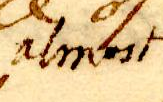almost
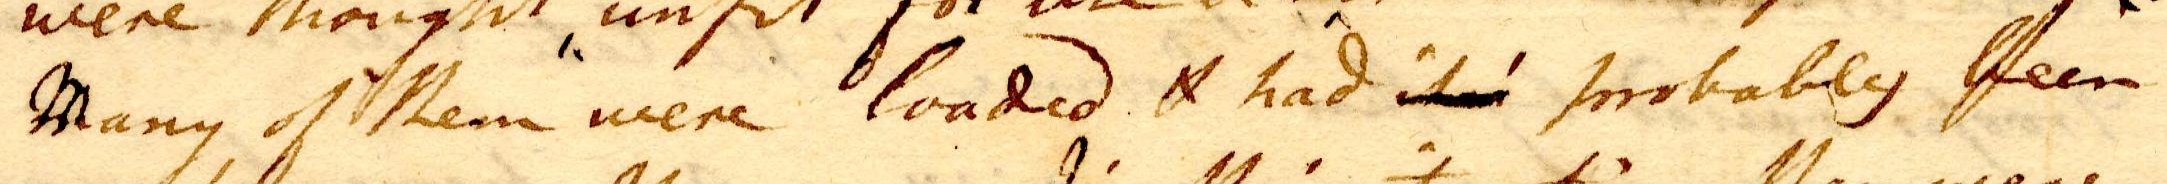Many of them were loaded & had [it is] probably been
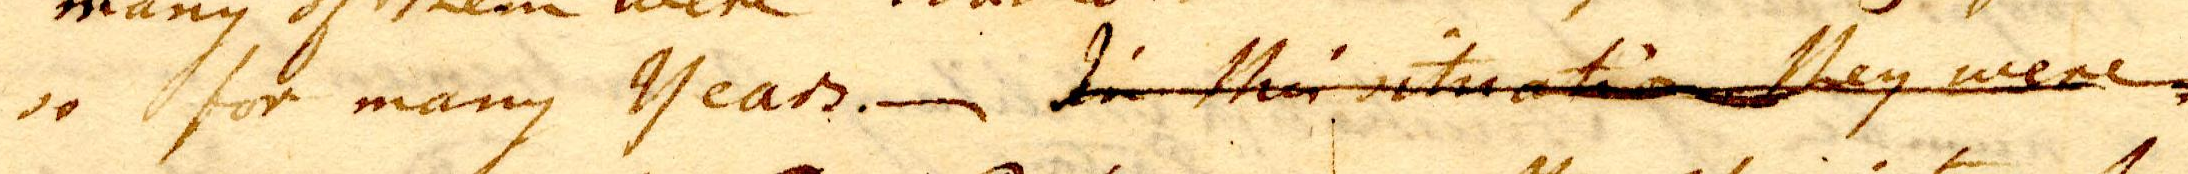so for many Years.- [In this situation they were]
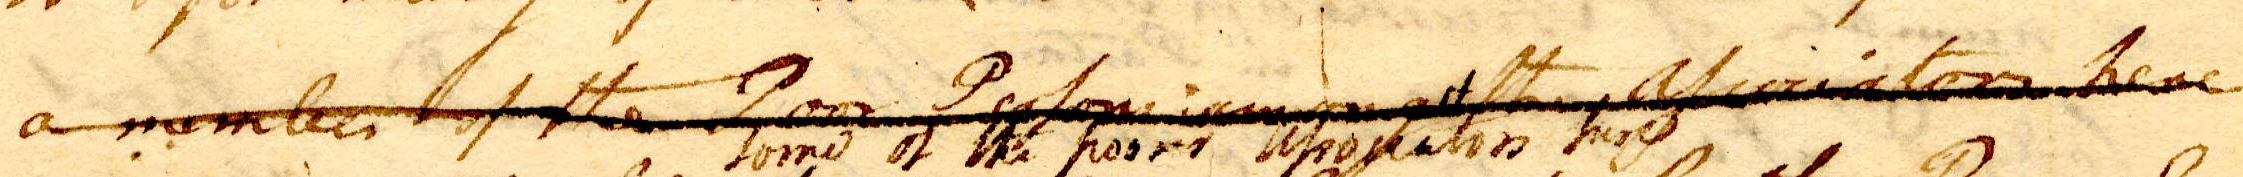[a member of the Poor Persons impart the Association here]
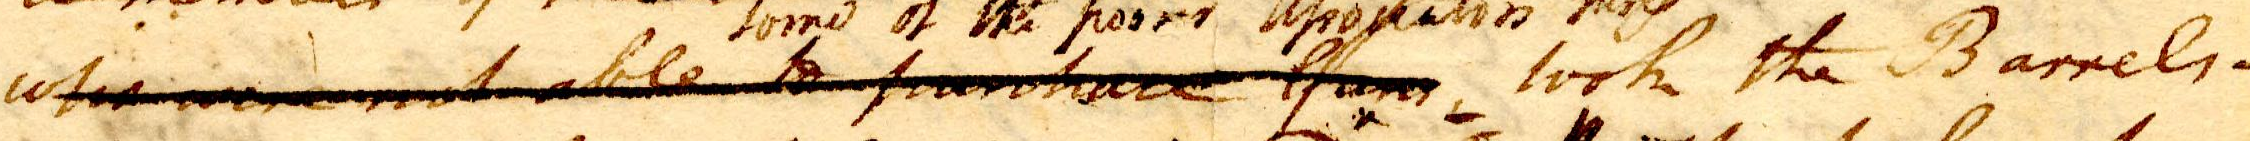[who were not able to purchase Guns] ^ took the Barrels
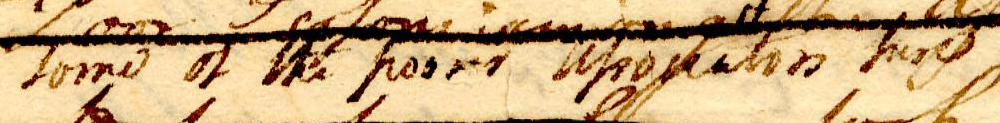Some of the poor associations here
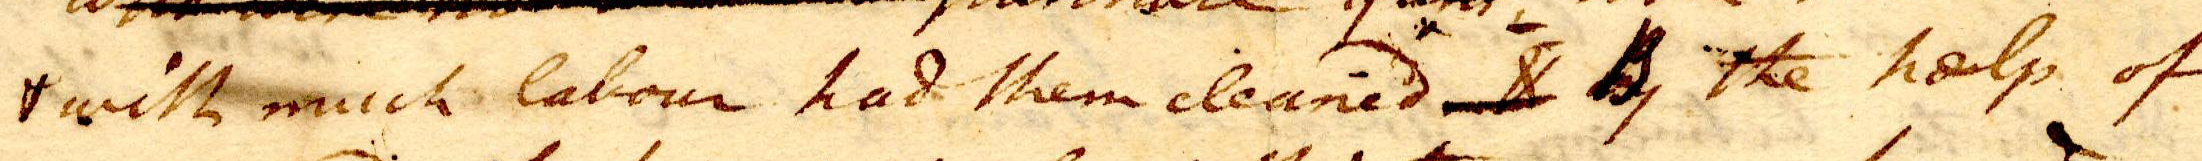& with much labour had them cleaned [&] By the help of
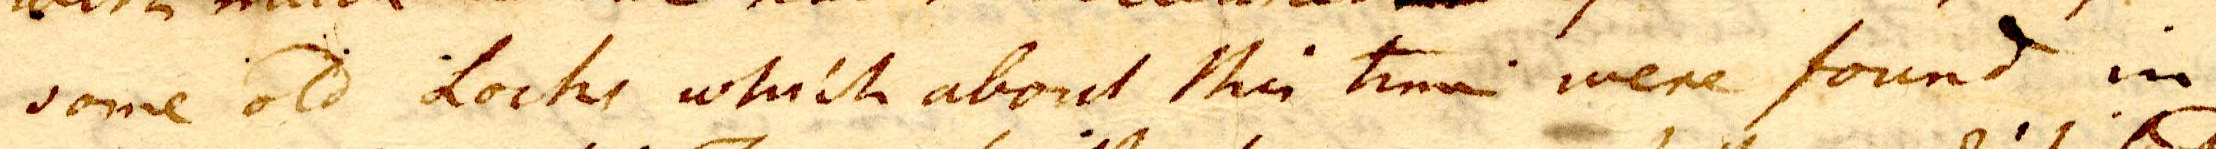some old Locks which about this time were found in
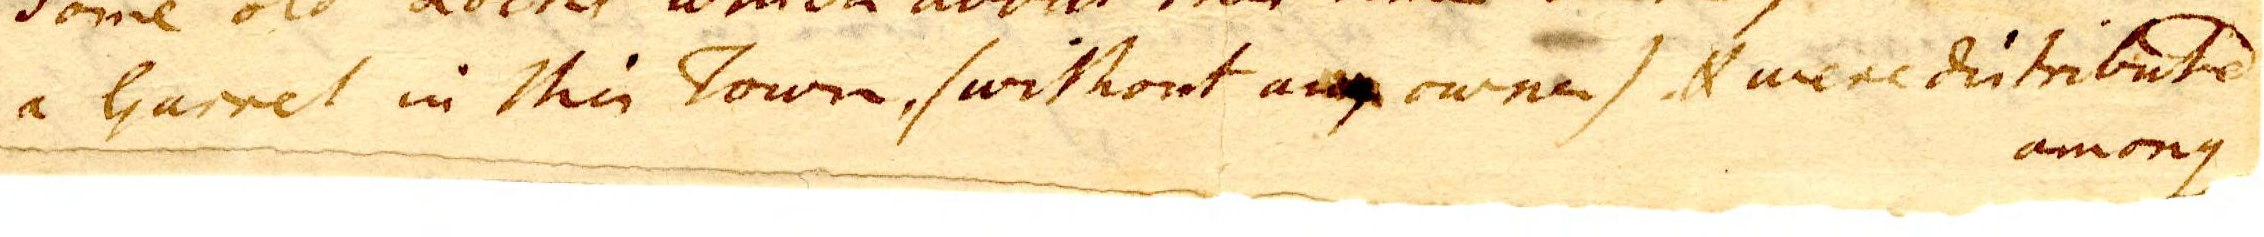a Garret ins this Town, (without any owner) & were distributed
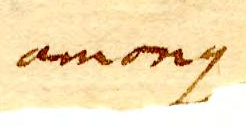among
